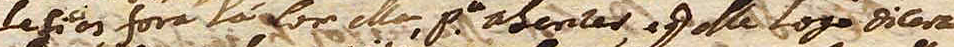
leficos, fora lá com ella, p.a a benzer, e q̄ elle logo dicera
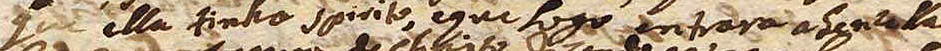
que ella tinha spirito, e que logo entrara a senzalla
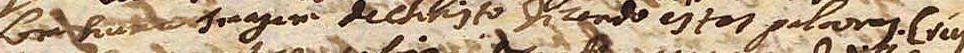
com huma Imagem de christo dizendo estas palavras. Crús,
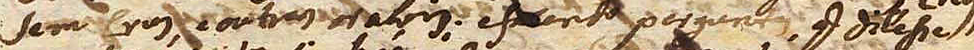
sem Crus, e outras oraCois; e fazendo perguntas, q̄ dicesse
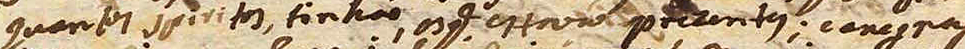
quantos spiritos, tinhaõ, os q̄ estavaõ prezentes; e a negra
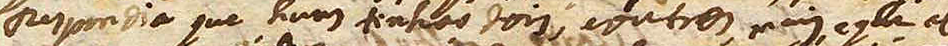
Respondia que huas tinhaõ dois, e outros, mais, e que al
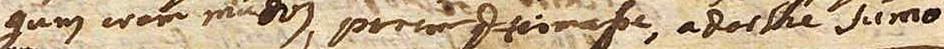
guns eram múdos, porem q̄ teimasse a darlhe sumo
